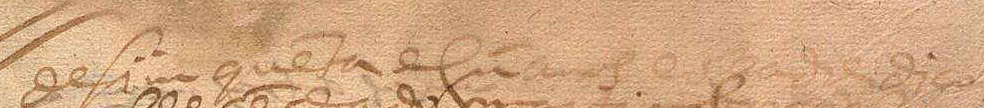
de simquēta e hū anos e o padre digo
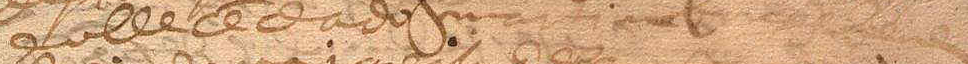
do llecēceado martim borges bene
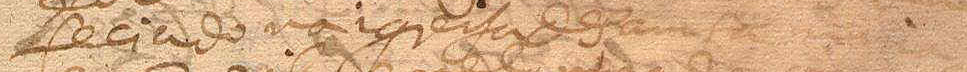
feciado na igreija de samta maria
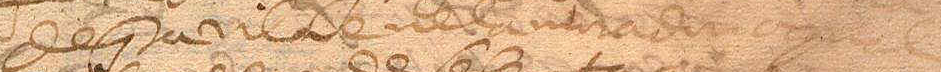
desta vila e nela morador o qual
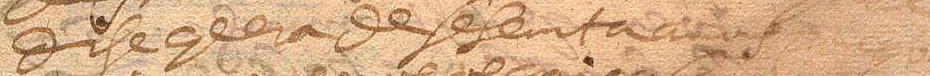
dise qe era de sesemta anos pouqo
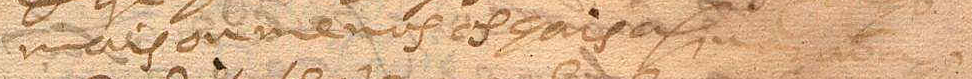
mais ou menos os qais asinaraõ
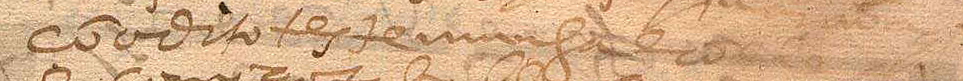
cō o dito testemunha e
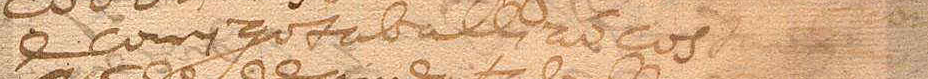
e comjgo taballiaõ cost
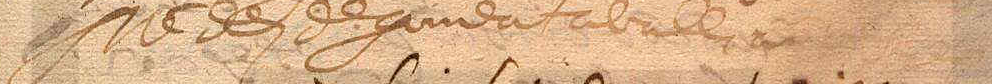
Mēdez de gouuea taballiaõ
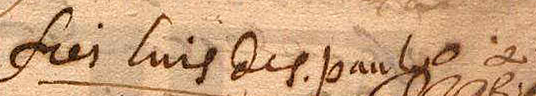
frei luis de s. paulo
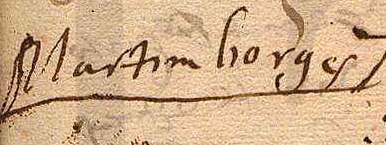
Martim borges /
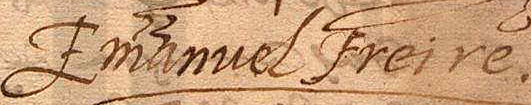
Em̄anuel Freire
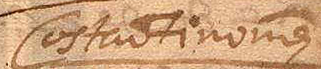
Costaõtino m̄ez
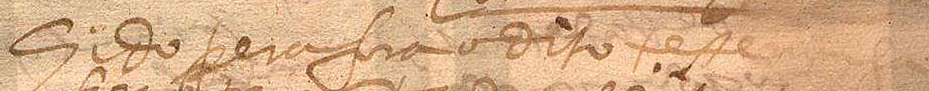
E ido pera fora o dito testemunha
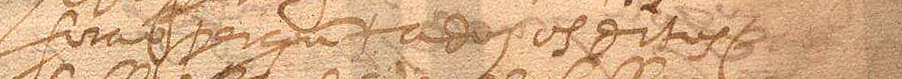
foraõ pergūtados os ditos p
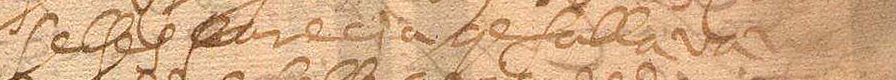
se lhes parecia qe fallava
